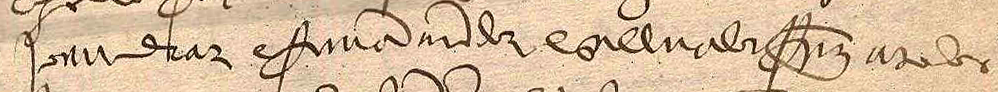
Joam diaz e fernā mēdez e salluador fr̄z a todos
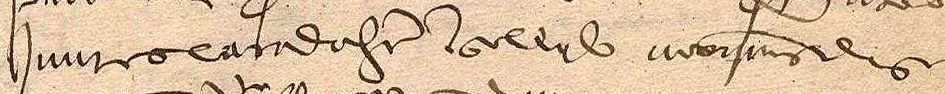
Juntos e a cada hū ē sollydo aos quaes dise
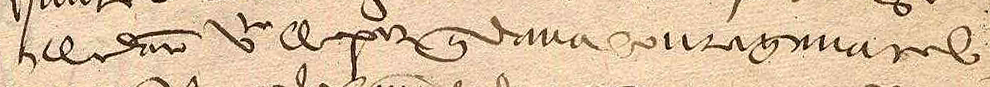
elle dito vte llopez q̄ daua e outorgaua todo
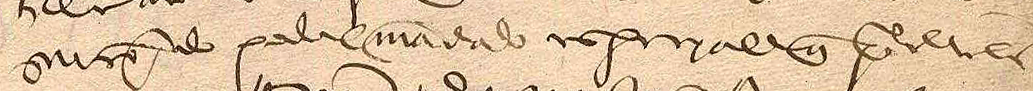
seu c̄op̄do poder e mādado especyall q̄ p̄o elle e ē
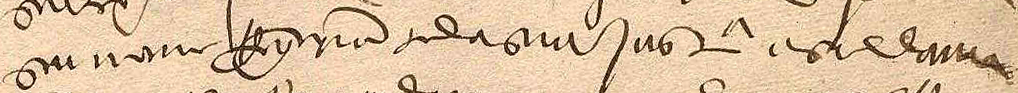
seu nome Reqyrā̄ toda sua Justa asy e da ma
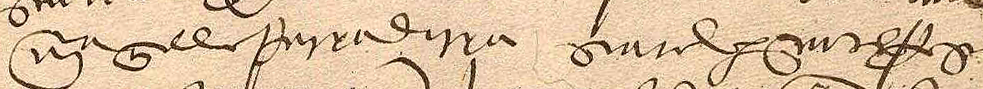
nra q̄ elle farya dirya se a todo ꝑsente fose
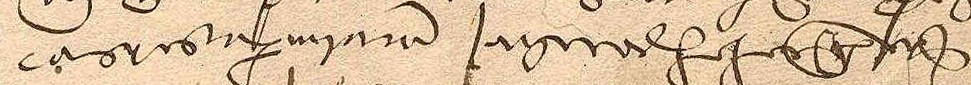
e asy esta ꝑcuraçā Jorge coelho ho esp̄vy
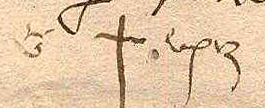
vte + lopez
